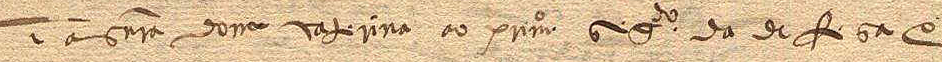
item a sn̄ra dona caterina ao primo. segdo. da defesa e
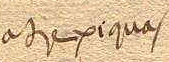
a trepiqua/
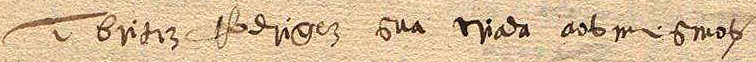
item britiz Rodrigez sua criada aos mesmos/
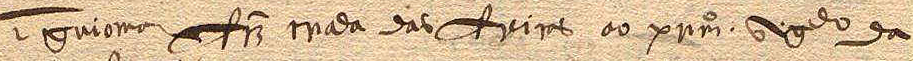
item guiomar fr̄z criada das freiras ao primo. segdo da
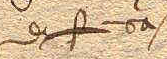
defesa/
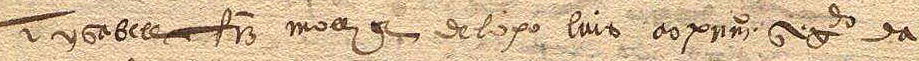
item ysabell fr̄z molher de lopo luis ao primo. segdo da
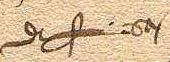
defesa/
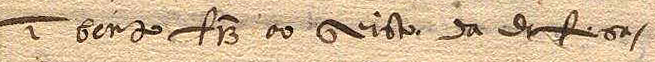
item bento fr̄z ao seisto da defesa/
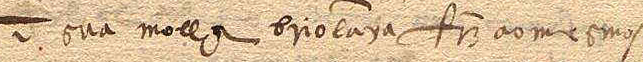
item sua molher briol̄aya fr̄z ao mesmo/
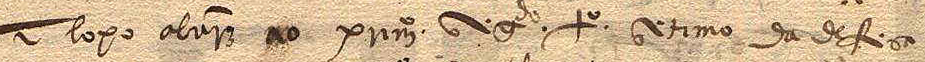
item lopo alur̄z ao primo. segdo. to. setimo da defesa
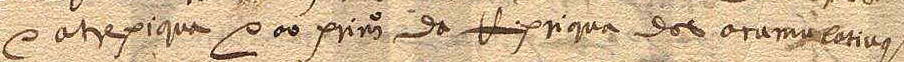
e a trepiqua e ao primo da Repriqua dos acumulatiuꝯ /
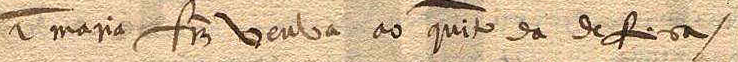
item maria fr̄z veuva ao q̄uito da defesa /
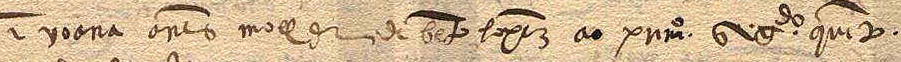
item yoana an̄es molher de b̄eto lopez ao primo. segdo. q̄uito.
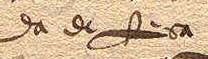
da defesa
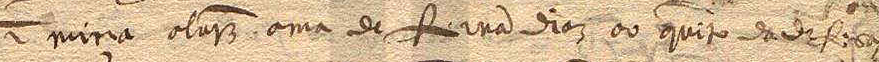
item miçia alūrz ama de fernā diaz ao q̄uito da defesa/
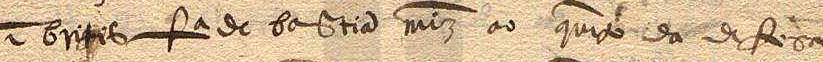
item brites fa de bastiā m̄iz ao q̄uito da defesa
